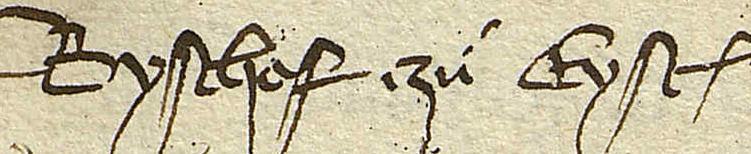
Byſchof cʒü Eyſt*
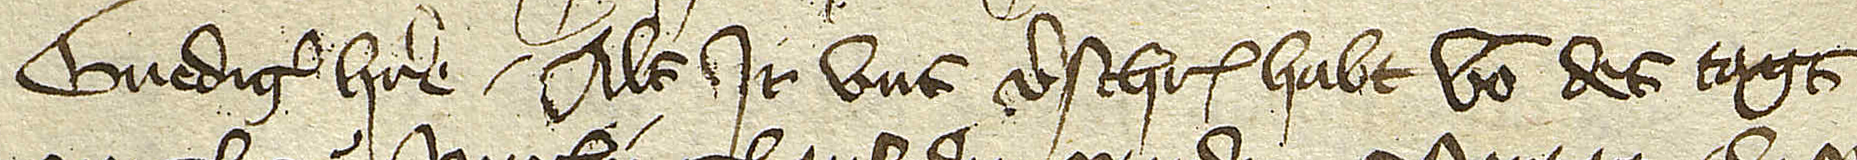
Gnedig* hr*e / Als Ir vns v*ſchr* habt vo* des tags
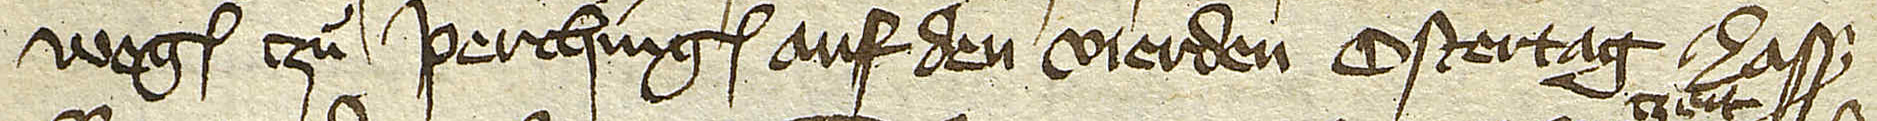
weg* cʒü Perching* auf den vierden Oſtertag / Laſſ*
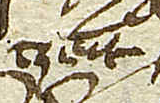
cʒeit
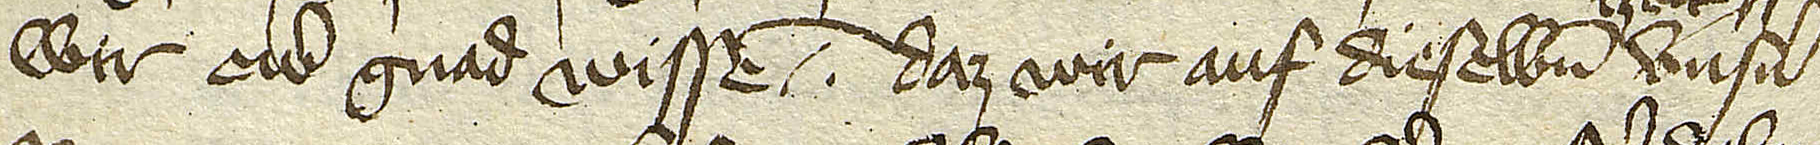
wir ew* gnad wiſſe* / . daʒ wir auf dieſelbn* vnſn*
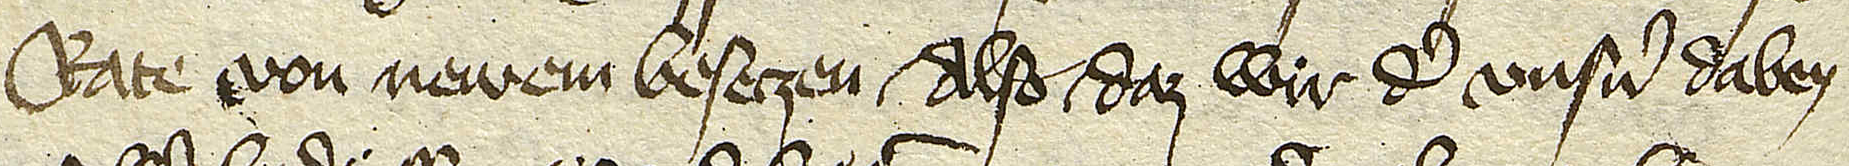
Rate von newem beſecʒen / Alſo / daʒ wir d* vnſn* dabey
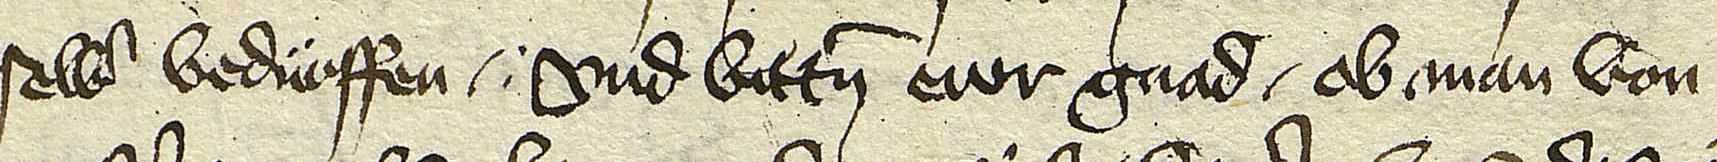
ſelb* bedürffen / . vnd bittn* ewr gnad / ob man von
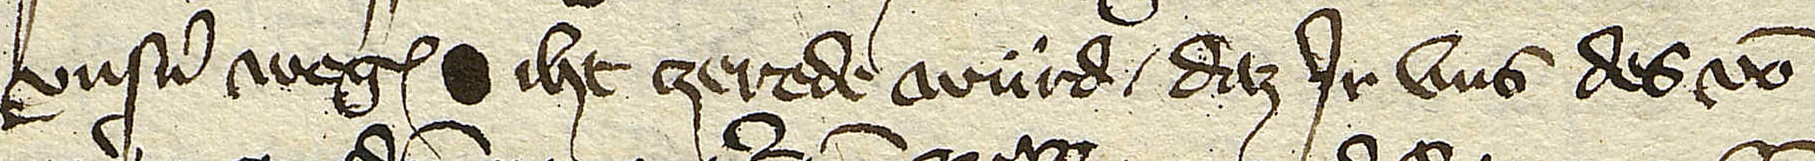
vnſn* weg* iht cʒerede würd / daʒ Ir vns des vo*
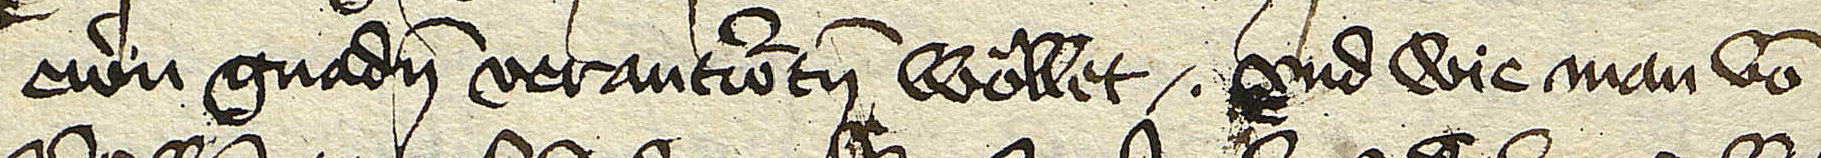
ew*n gnadn* verantwt*n* wöllet / . vnd wie man vo*
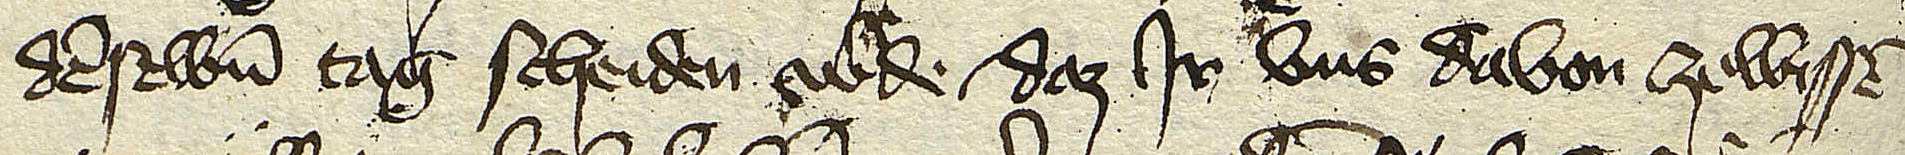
de*ſelbn* tag ſcheiden w*de / daʒ Ir vns davon cʒewiſſe*
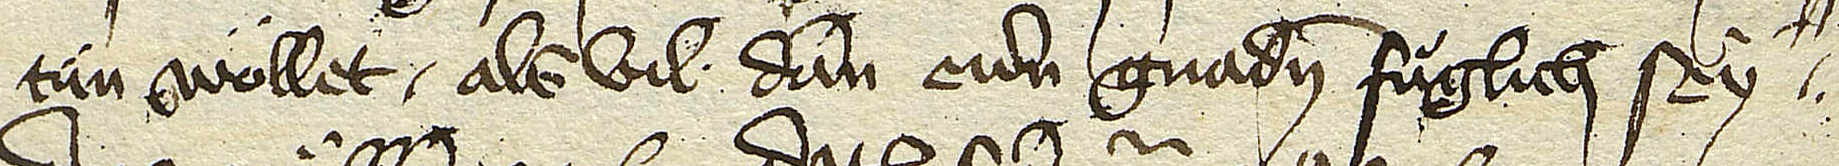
tün wöllet / als vil dan* ew*n gnadn* füglich ſey / .
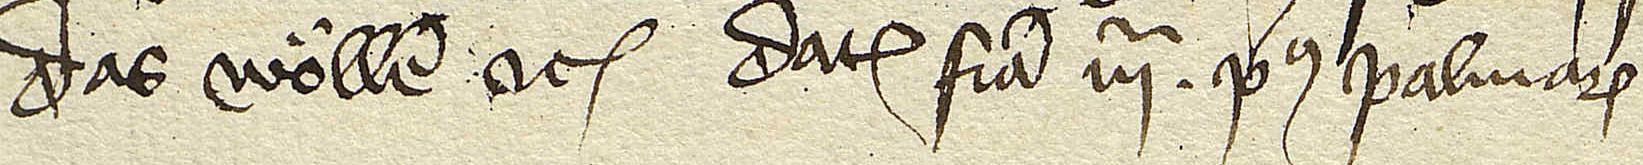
Das wölle* ec* Dat* fia* iii* . p* palma*
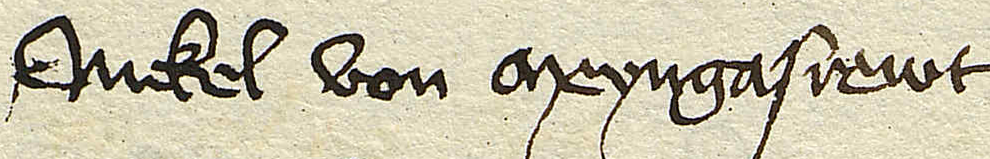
Nickel von Meyngaſrewt
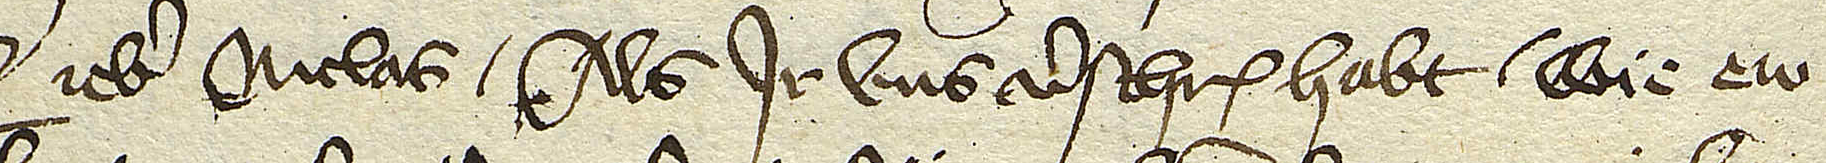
Lieb* Niclas / Als Ir vns v*ſchr* habt / wie ew
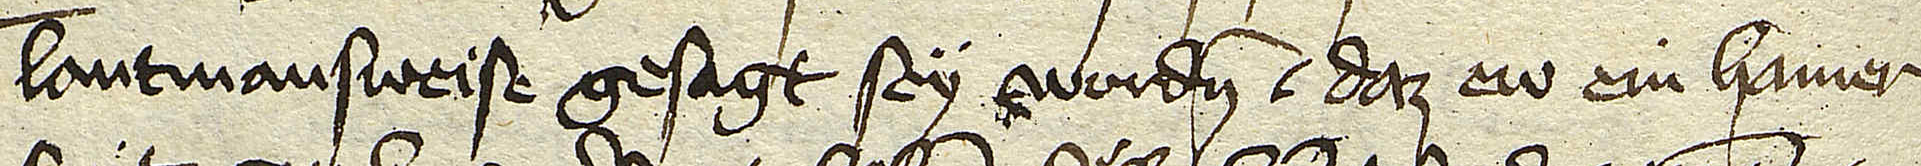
lantmanſweiſe geſagt ſey wordn* / daʒ ew ein hamer
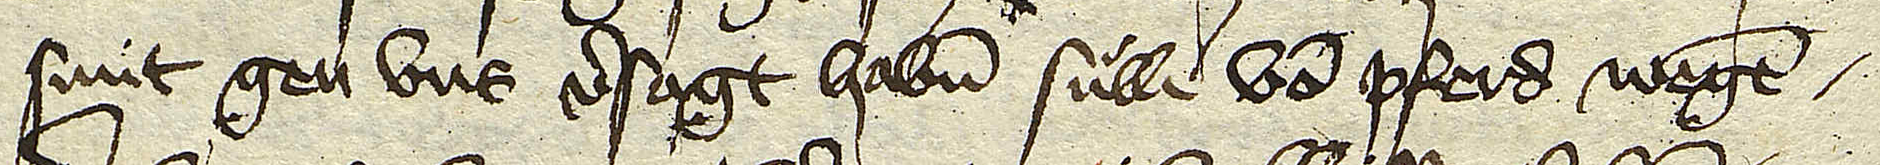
ſmit gen vns v*ſagt habn* ſülle vo* pferd wege* /
